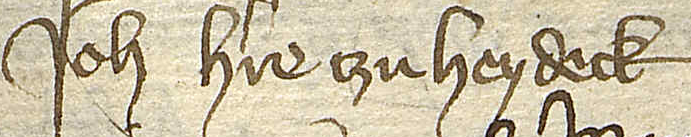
Ioh* h*re cʒu heydeck
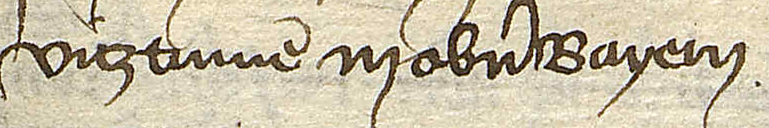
vicʒtume* in obn* Bayern
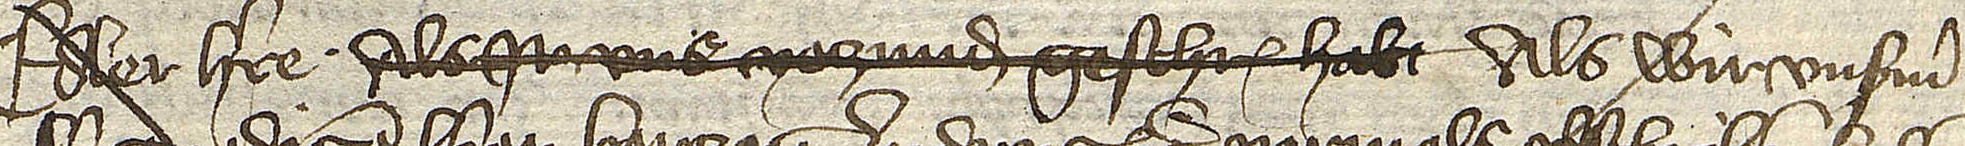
Edler h*re . Als Ir vns yecʒund* geſchr* habt Als wir vnſ*m*
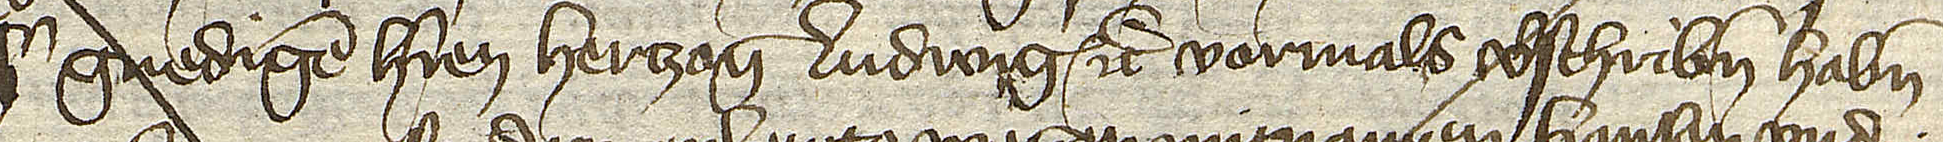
h* gnedige* h*ren hercʒog* Ludwig* ec* vormals v*ſchribn* habn*
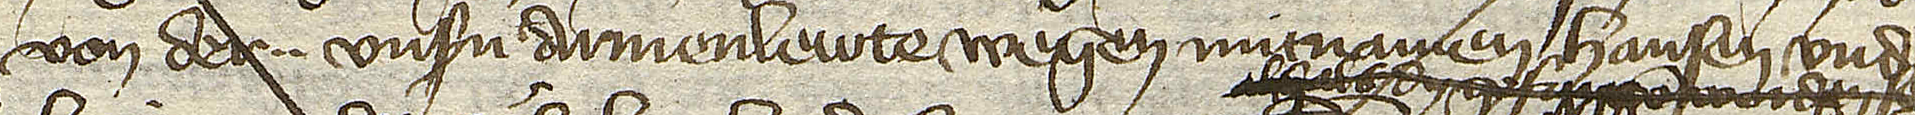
von der ~ vnſ*n Armenlewte wegen mitnamen hanſen vnd
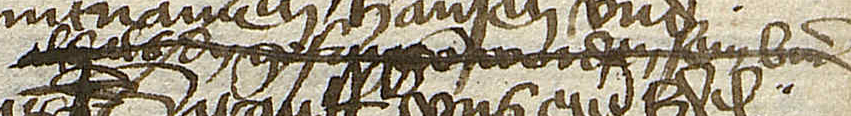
als als dy gefange* worden ſein vnd
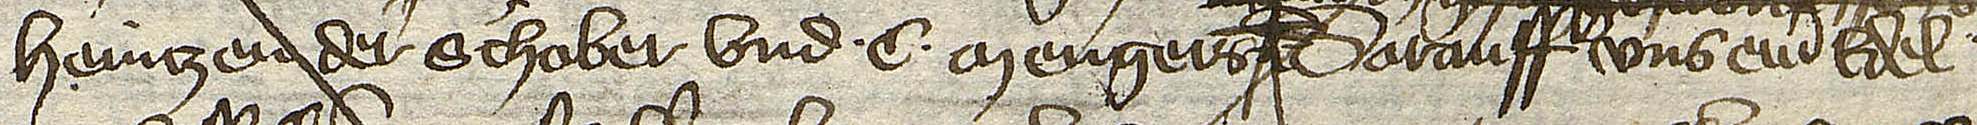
heincʒen der Schöber vnd . C . Mengers Darauff vns ew* Edel
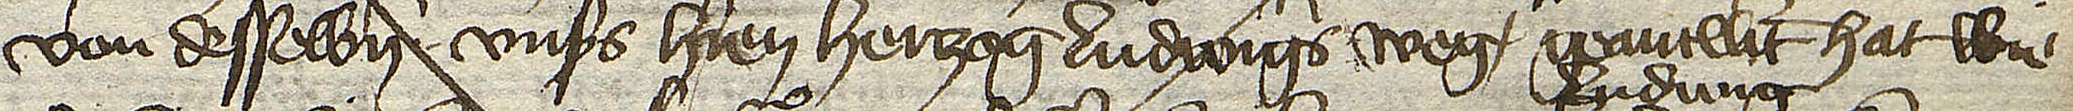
von deſſelbn* ~ vnſ*s h*ren hercʒog Ludwigs weg* geantw*t hat wie
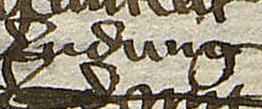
Ludwig
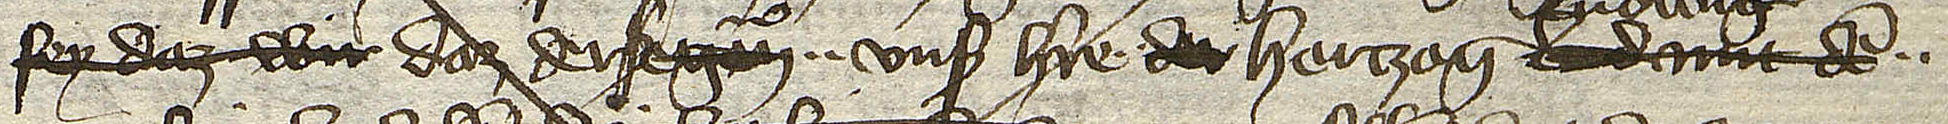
ſey daʒ wir daʒ derſ*egen* ~ vnſ* h*re ~ der hercʒog Lud mit de* ~
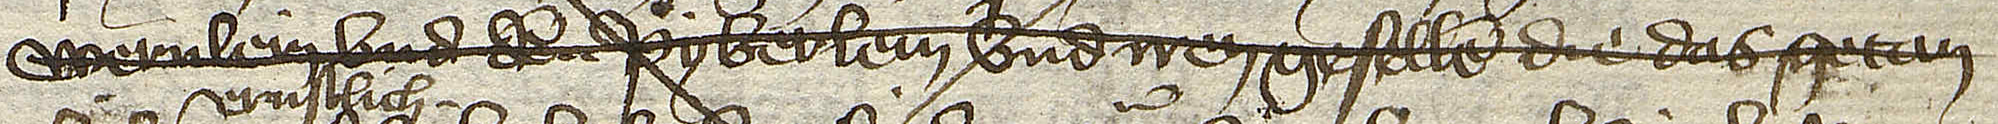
wernlein vnd de* ~ Pyberlein vnd iren geſelle* die das getan
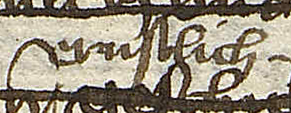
ernſtlich
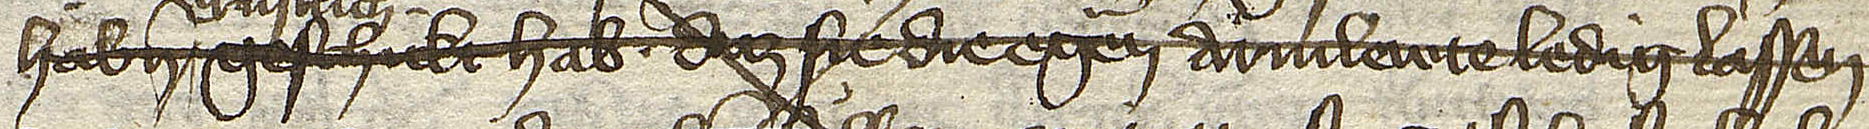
habn* geſchickt hab . daʒ ſie die egen* Armlewte ledig laſſen
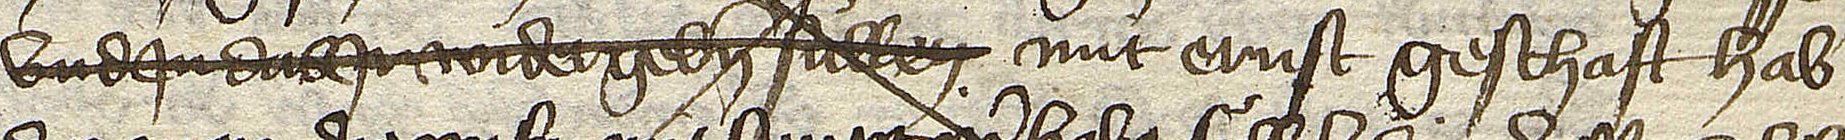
vnd In das Ir wider gebn* ſüllen mit ernſt geſchaft hab
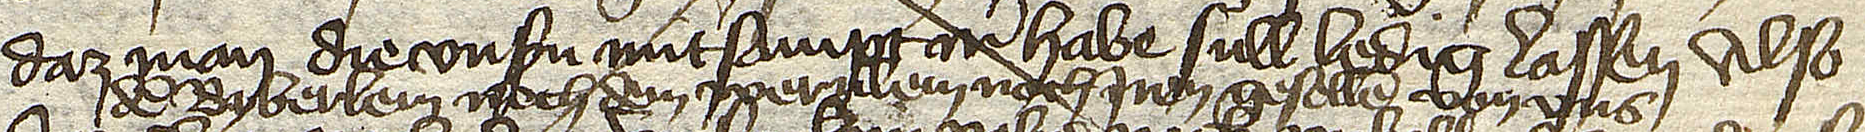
daʒ man die vnſ*n mit ſampt ir* habe ſüll ledig laſſen Alſo
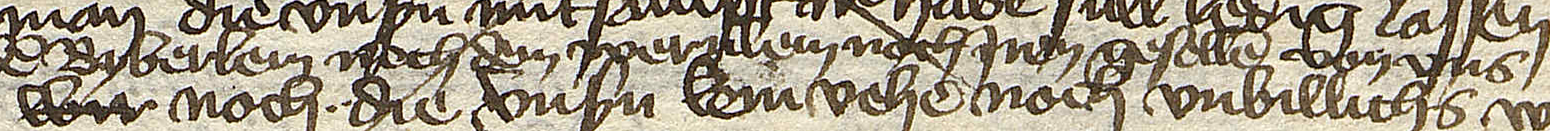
de* Byberlein noch dem wernlein noch Iren geſelle* von vns
